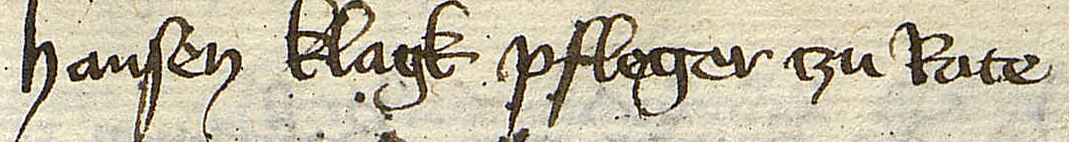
hanſen klagk pfleger cʒu Rote
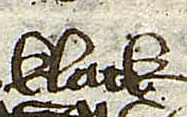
klack
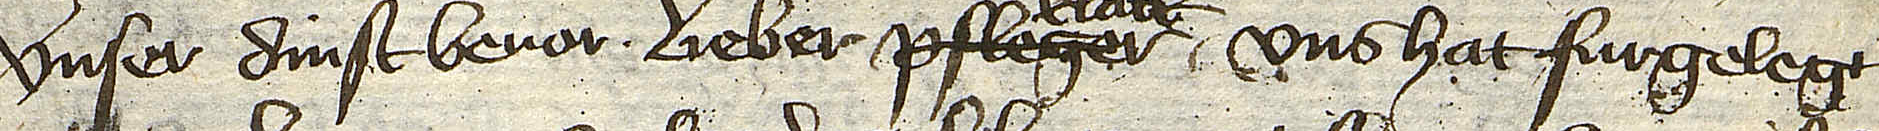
Vnſer dinſt beuor . Lieber pfleger / vns hat furgelegt
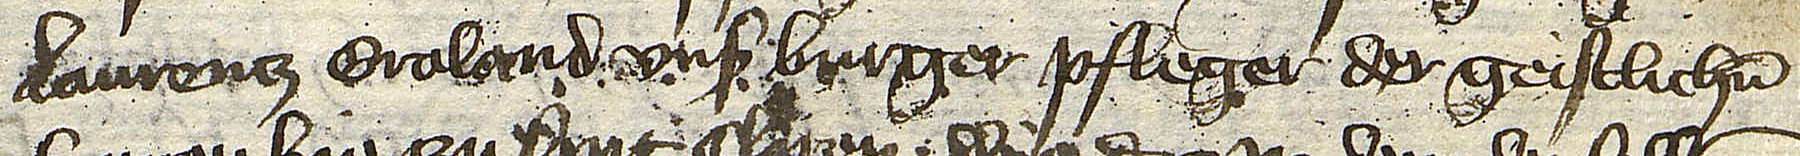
laurencʒ Groland vnſ* burger pfleger der geiſtlichn*
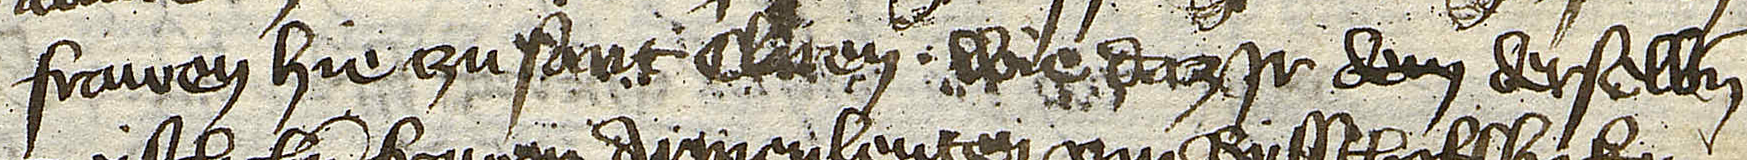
frawen hie cʒu ſant Claren wie daʒ ir dem derſelbn*
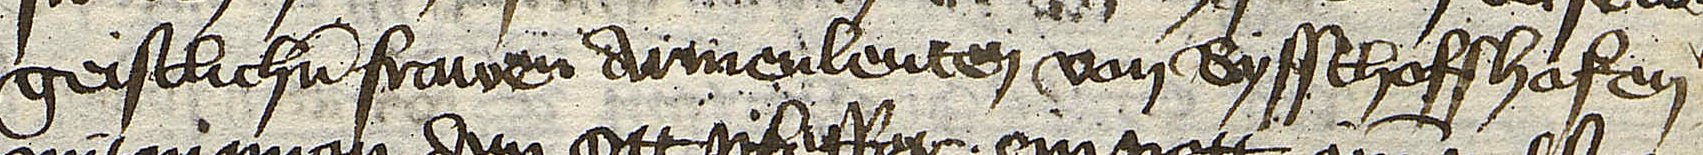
geiſtlichn* frawe Armenleuten von Byſſchoffhofen
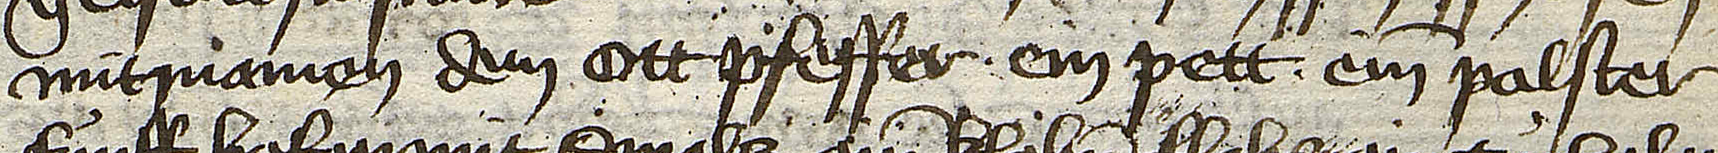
mitnamen dem Ott pfeffer ein pett ein* polſter
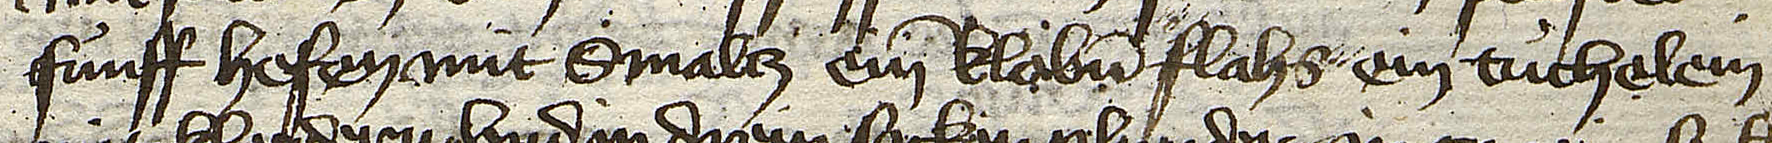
fünff hefen mit Smalcʒ ein* klobn* flahs ein tüchelein
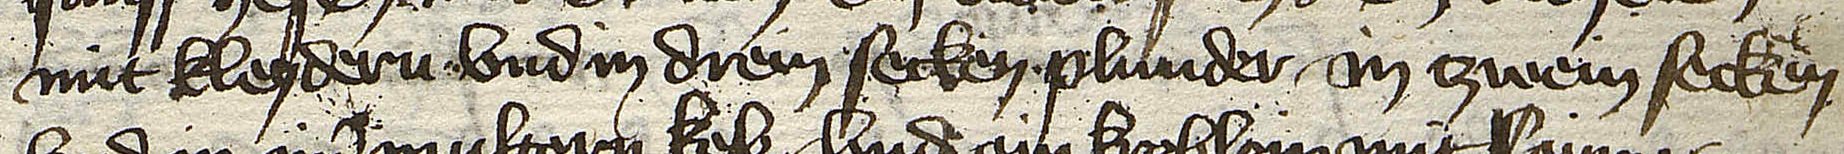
mit kleydern vnd in drein ſecken plunder / in cʒwein ſecken
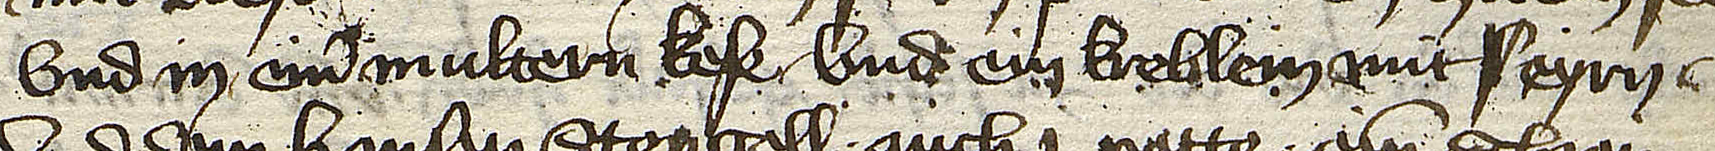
vnd in ein* multern keſe / vnd ein krehlein mit ſ eyrn /
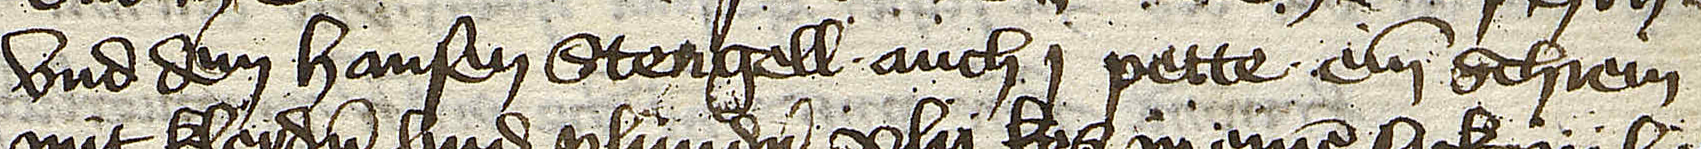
vnd dem hanſen Stengell auch i pette . ein* Schrein
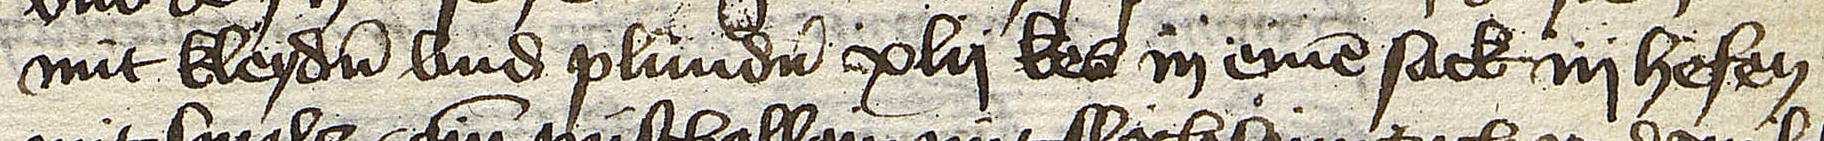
mit kleydn* vnd plundn* xlii kes in eine* ſack iii hefen
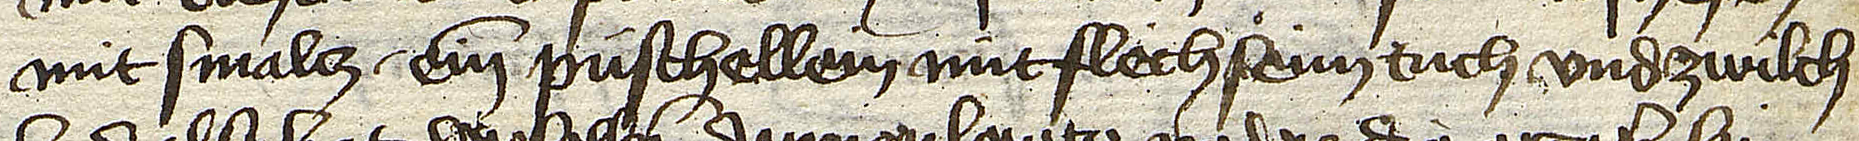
mit ſmalcʒ / ein* püſchellein mit fleichſeim tuch vnd cʒwilch
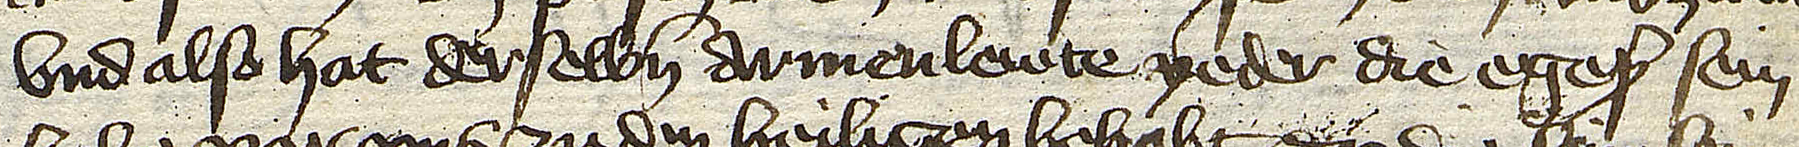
vnd alſo hat derſelbn* Armenleute yeder die egeſ* ſein
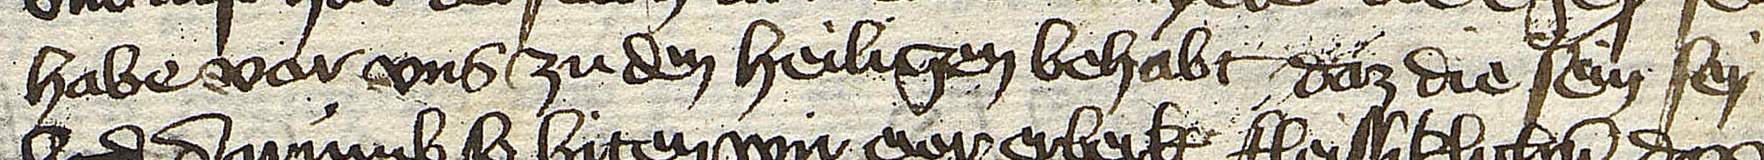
habe vor vns cʒu den heiligen behabt / daʒ die ſein ſey
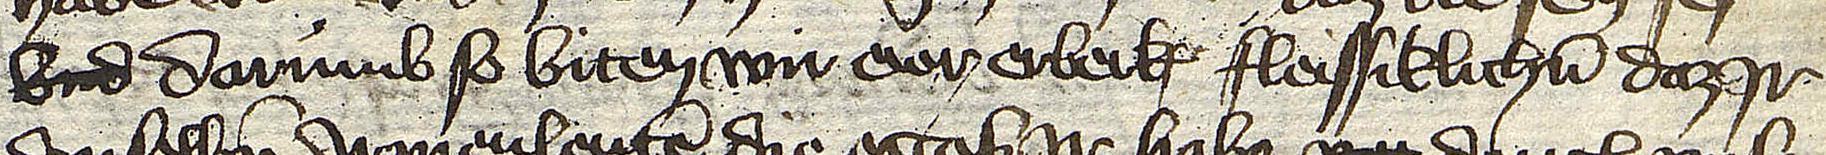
vnd Darümb ſo biten wir ewr erberk* fleiſſiklichn* daʒ Ir
